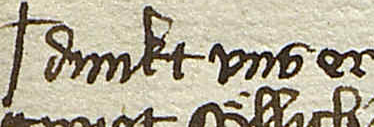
dunkt vns er
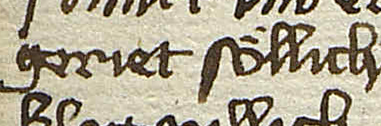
geriet ſöllich*
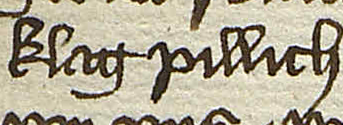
klag pillich
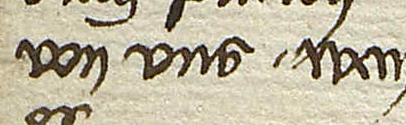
von vns . wan
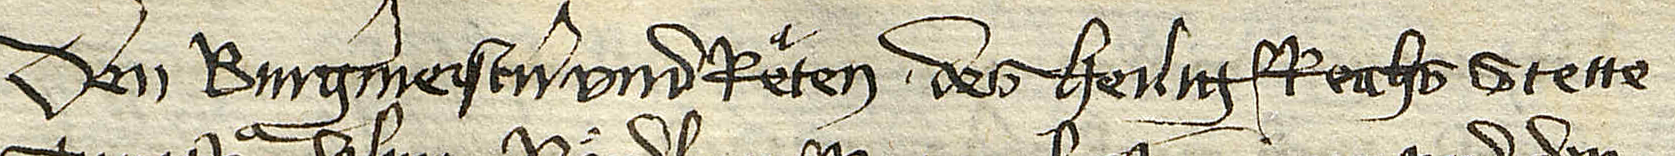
Den Burg*meiſt*n vnd Rëten / Des Heilig* Reichs Stette
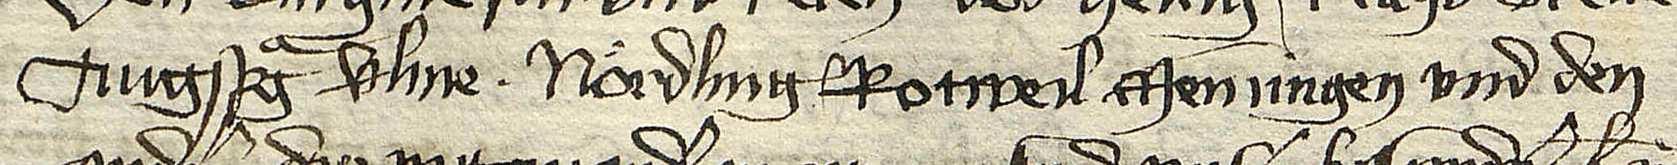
Augſp*g Vlme . Nördling* Rotweil Mem*ingen vnd den
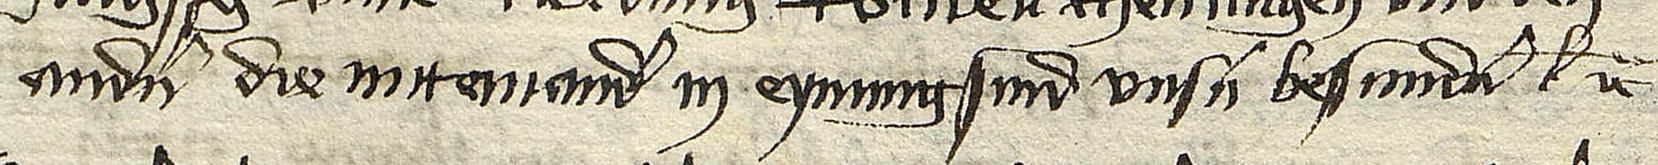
andn* die miteinand* in eynung ſind vnſn* beſundn* l* ec*
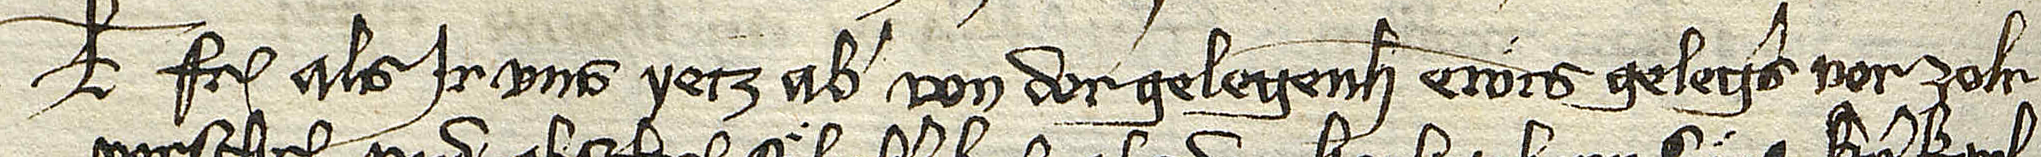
L* fr* als Ir vns yecʒ ab* von der gelegenh* eẅrs geleg*s vor ʒolr
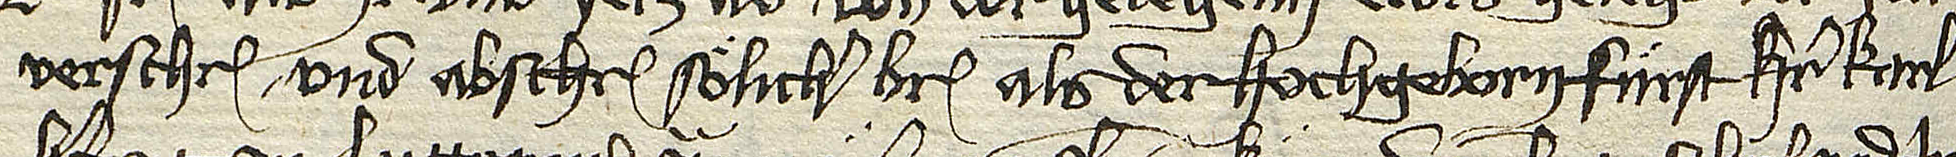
verſchr* / vnd abſchr* ſölich* br* als der Hochgeborn fürſt hr* karl
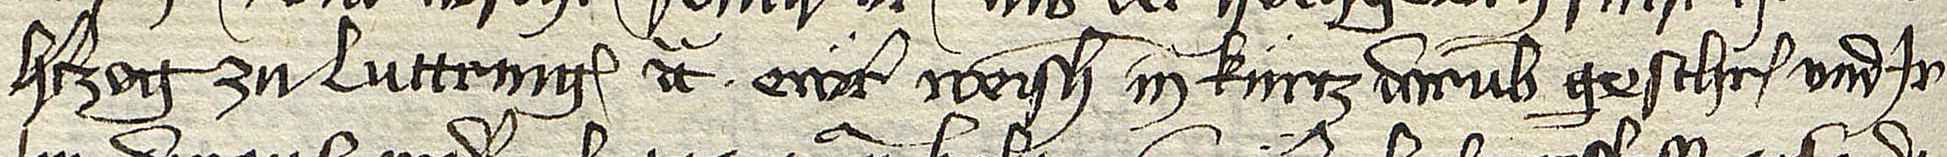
h*erʒog ʒu Luttring* ec* . eẅr* weiſh* in kürcʒ darub* geſchr* und Ir
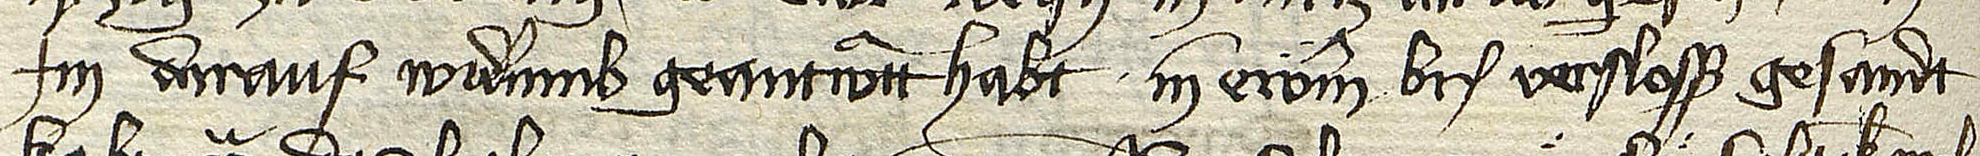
Im darauf wid*umb geantw*rt habt . in eẅm* br* verſloſſ* geſandt
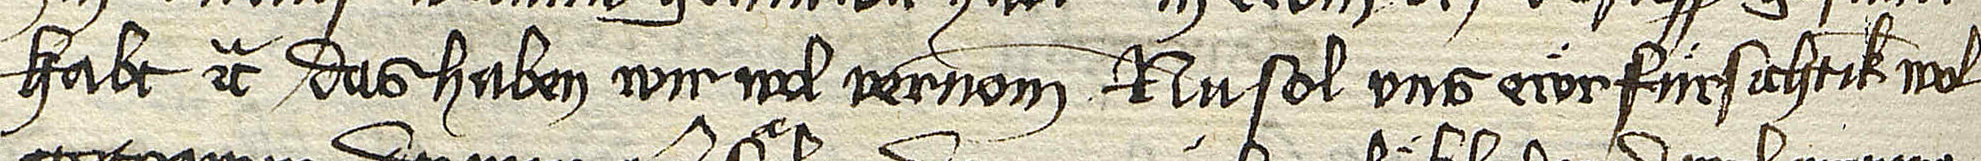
habt ec* das haben wir wol vernom* . Nu ſol vns eẅr fürſichtik* wol
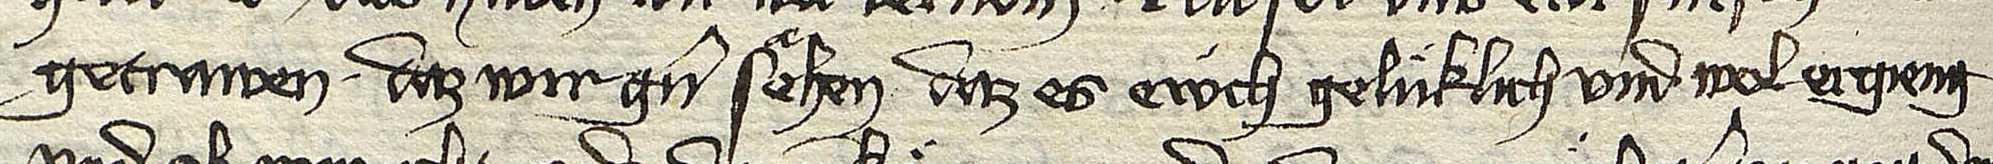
getrawen . Daʒ wir g*n ſëhen daʒ es eẅch gelüklich vnd wol ergieng
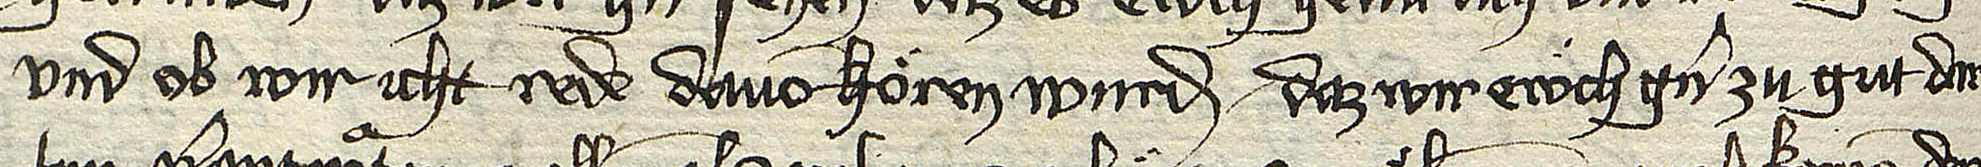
und ob wir icht rede dauo* hören wurd* / daʒ wir eẅch g*n ʒu gut dar
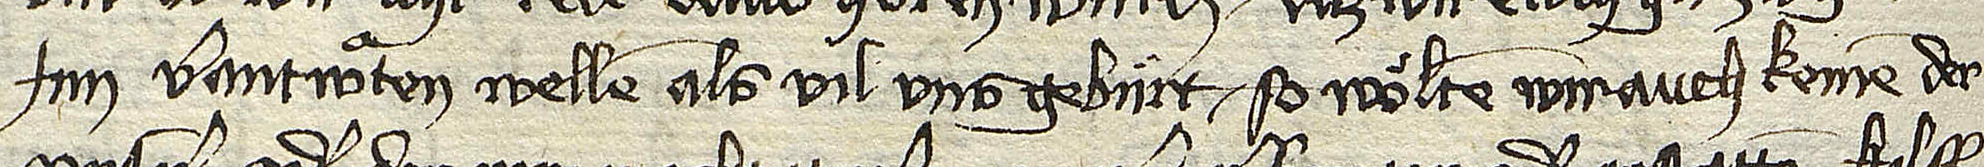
Inn v*antw*ten welle* als vil vns gebürt / ſo wölte* wir auch keine* der
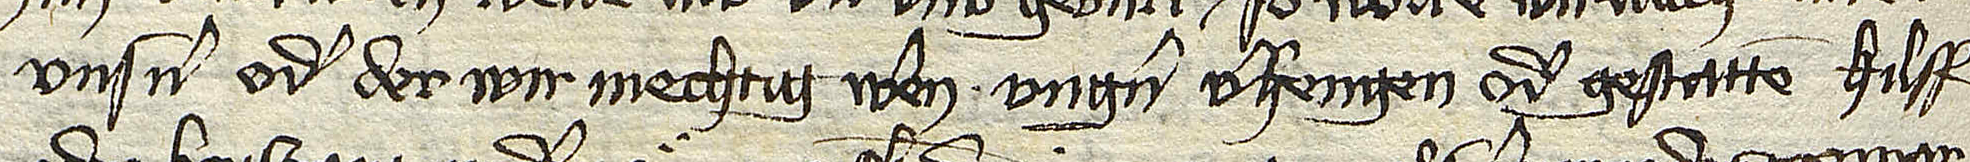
vnſ*n od* der wir mechtig we*n . vngn* v*hengen od* geſtatte* hilff
